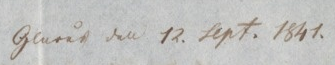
Glarus den 12. Sept. 1841.
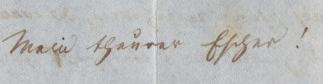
Mein theurer Escher!
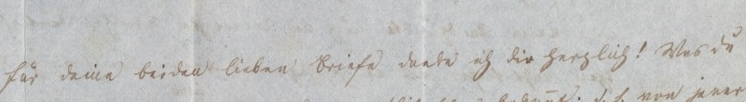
Für deine beiden lieben Briefe danke ich dir herzlich! Was du
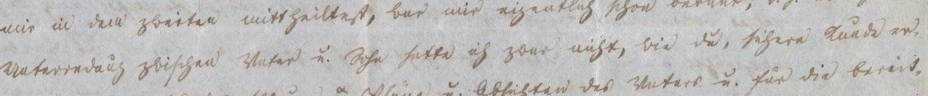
Unterredung zwischen Vater u. Sohn hatte ich zwar nicht, wie du, sichre Kunde er-
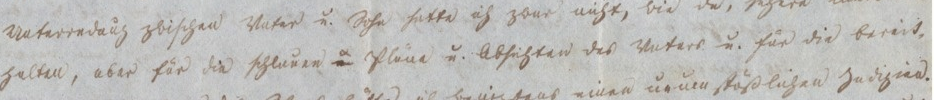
halten, aber für die schlauen u. Pläne u. Absichten des Vaters u. für die bereit-
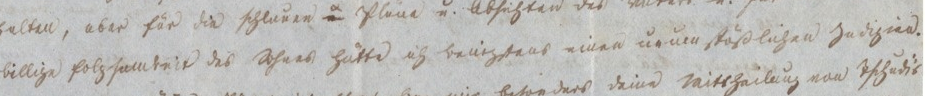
willige Folgsamkeit des Sohnes hätte ich wenigstens einen unumstößlichen Indizien-
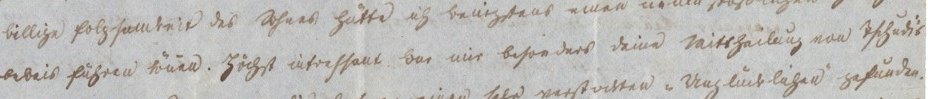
beweis führen können. Höchst intressant war mir besonders deine Mittheilung von Tschudi's
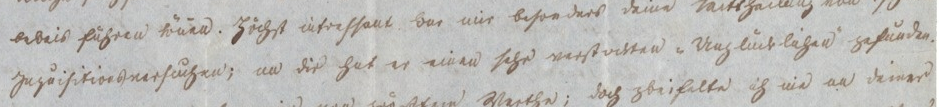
Inquisitionsversuchen; an dir hat er einen sehr verstockten «Unglücklichen» gefunden.
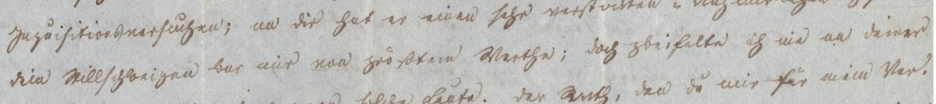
Dein Stillschweigen war mir von größtem Werthe; doch zweifelte ich nie an deiner
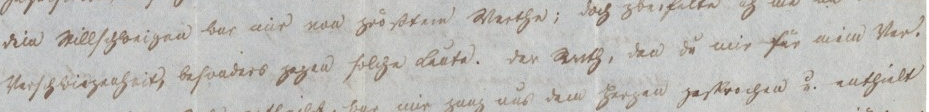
Verschwiegenheit, besonders gegen solche Leute. Der Rath, den du mir für mein Ver-
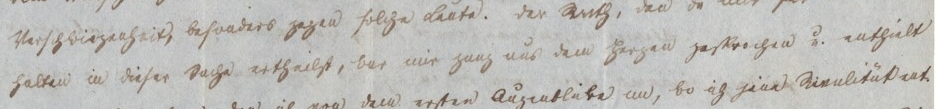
halten in dieser Sache ertheilst, war mir ganz aus dem Herzen gesprochen u. enthielt
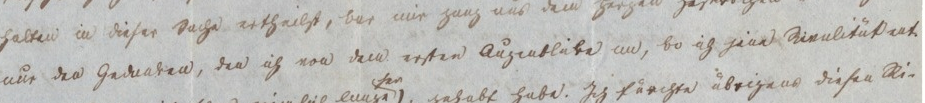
nur den Gedanken, den ich von dem ersten Augenblicke an, wo ich jene Rivalität ent-
